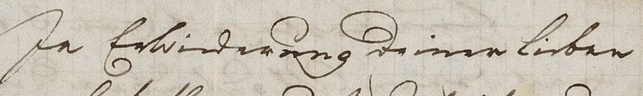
In Erwiederung Deiner lieben
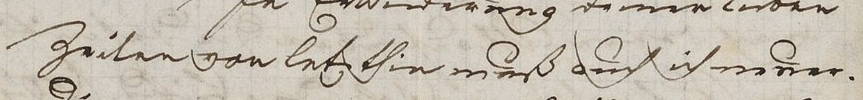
Zeilen von letzthin muß auch ich neuer-
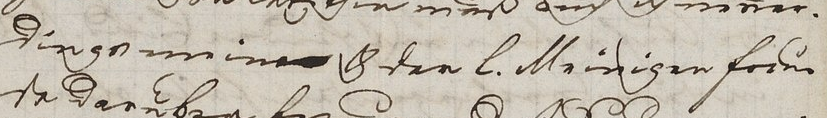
dings meiner & der l. Meinigen Freu-
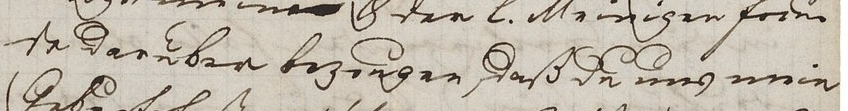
de darüber bezeugen, daß Du uns mein
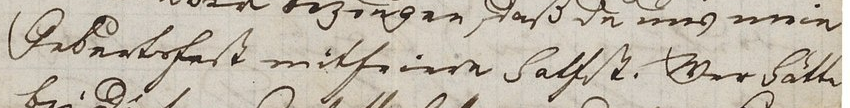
Geburtsfest mitfeiern halfst. Wer hätte
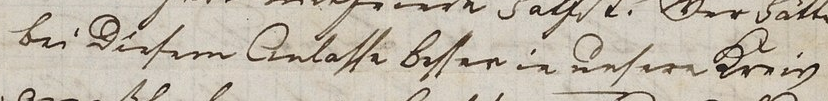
bei diesem Anlasse besser in unsern Kreis
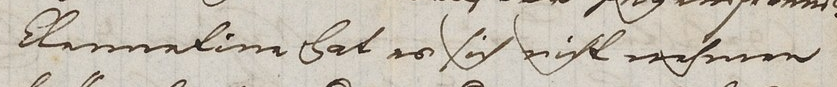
Clementine hat es sich nicht nehmen
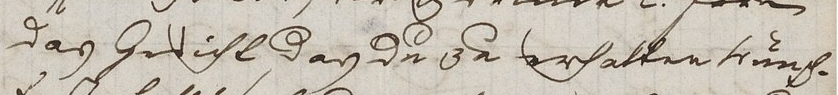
das Gedicht, das Du zu erhalten wünsch-
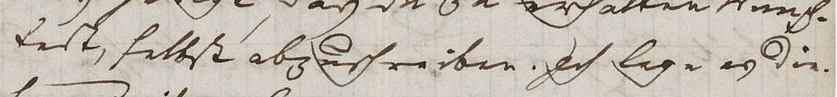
test, selbst abzuschreiben. Ich lege es die-
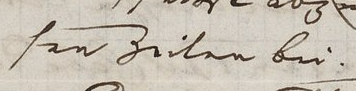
sen Zeilen bei.
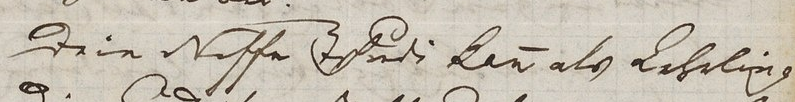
Dein Neffe Tschudi kann als Lehrling
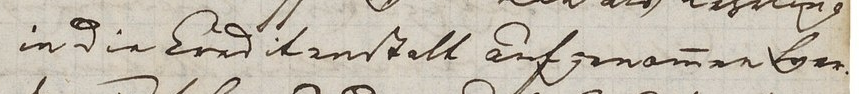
in die Creditanstalt aufgenommen wer-
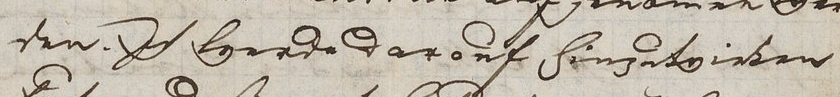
den. Ich werde darauf hinzuwirken
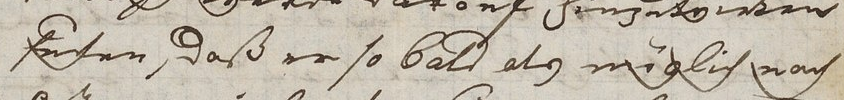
suchen, daß er so bald als möglich nach
